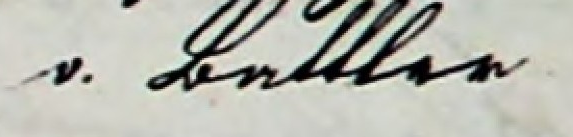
v. Battler
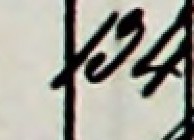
134
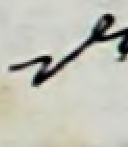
do
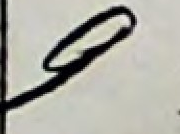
9
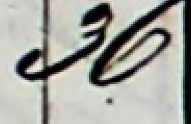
36
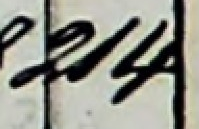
214
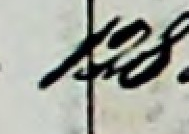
128
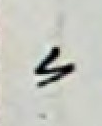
„
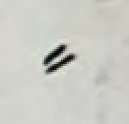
„
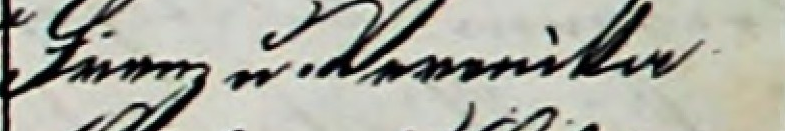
Franz u. Veronika
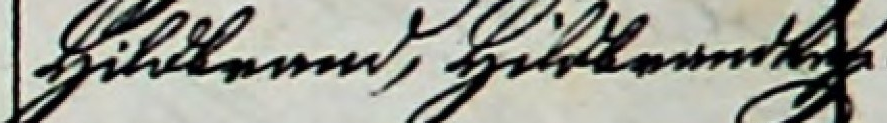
Hildbrand, Hildbrandkof.
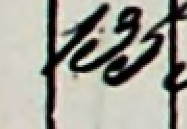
135
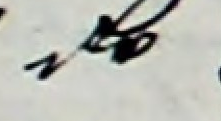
do
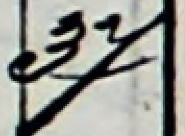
37
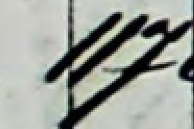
117
